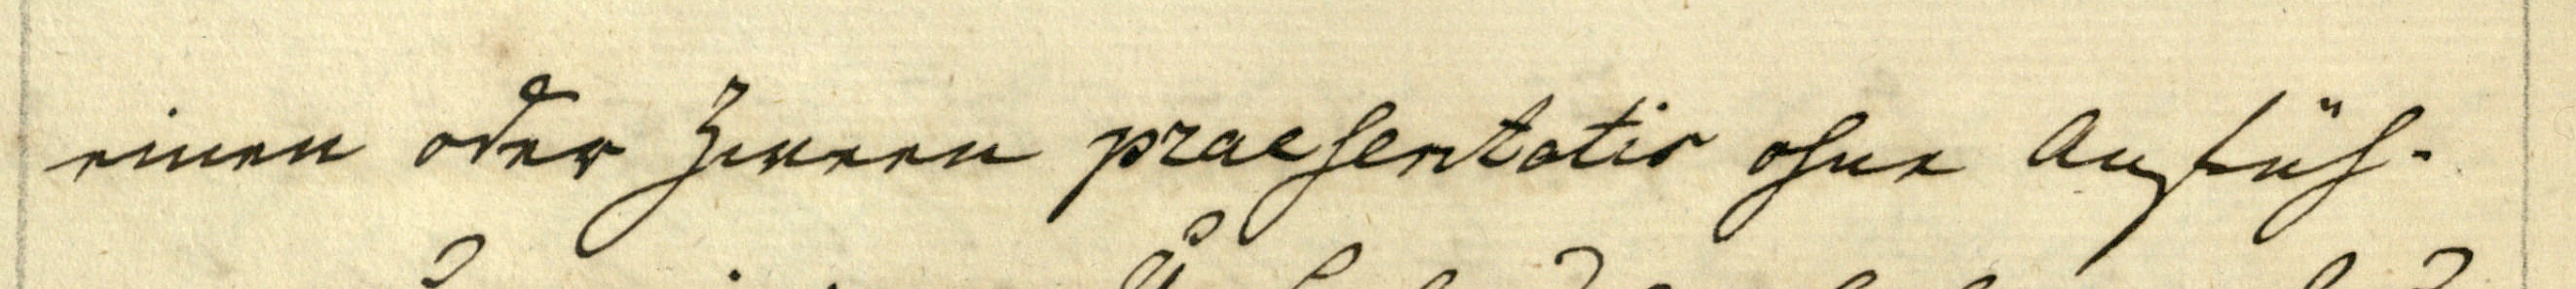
einen oder zween praesentatis ohne Anfüh¬
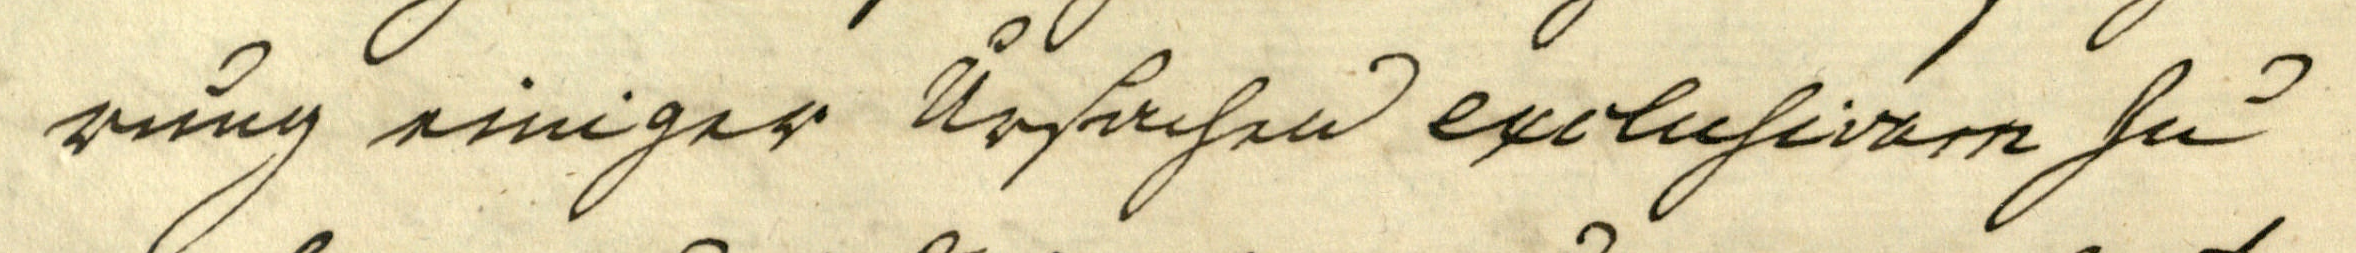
rung einiger Ursachen exclusivam zu
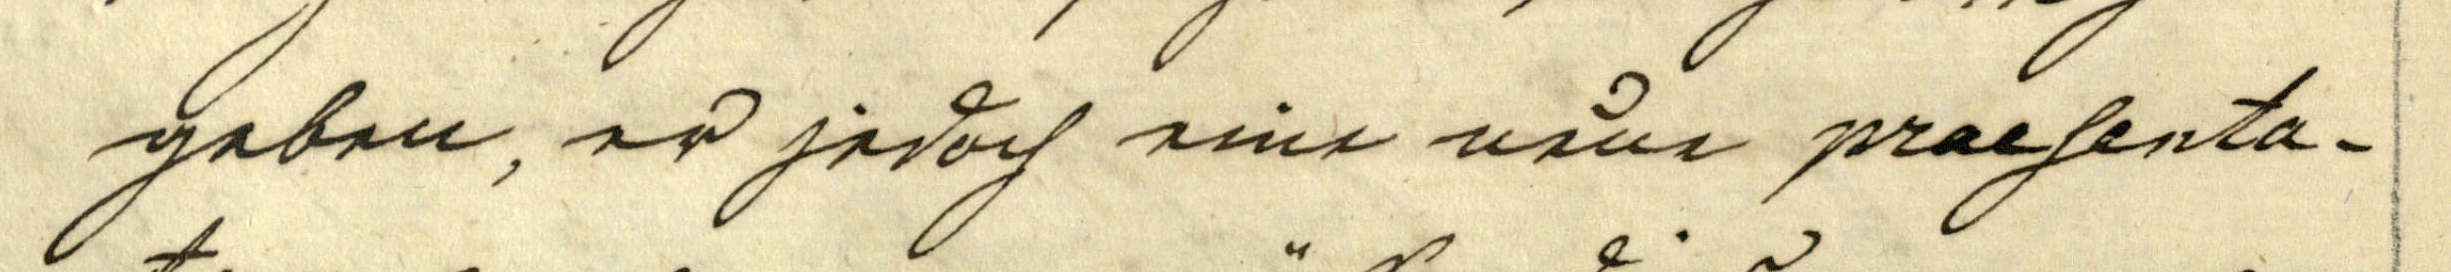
geben, er jedoch eine neue praesenta¬
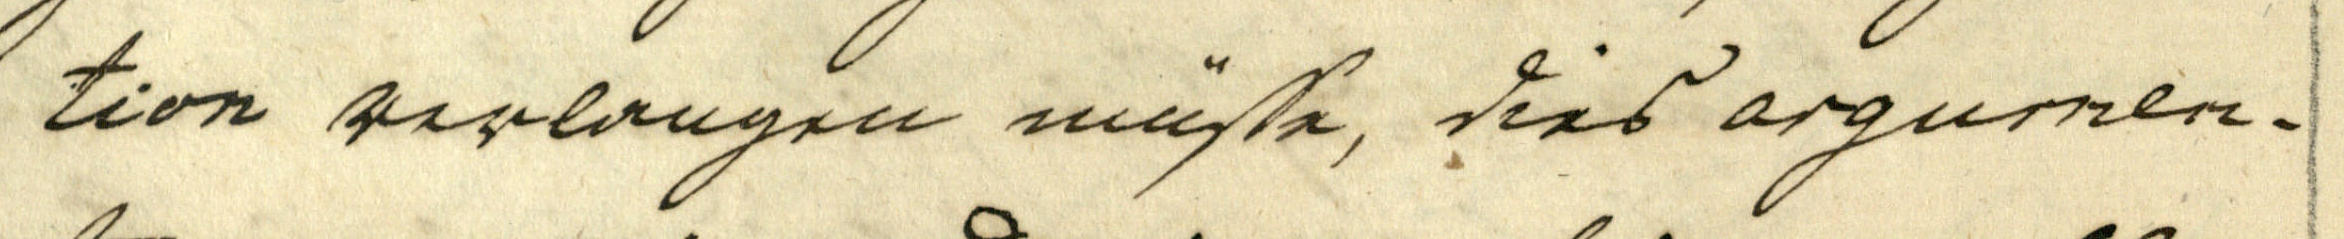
tion verlangen müsse, dies argumen¬
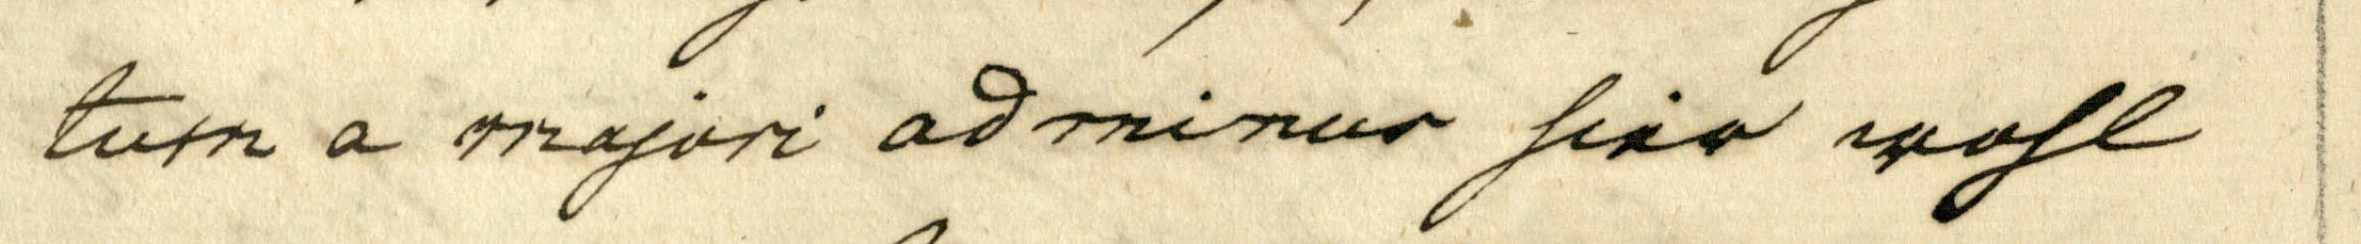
tum a majori ad minus hier wohl
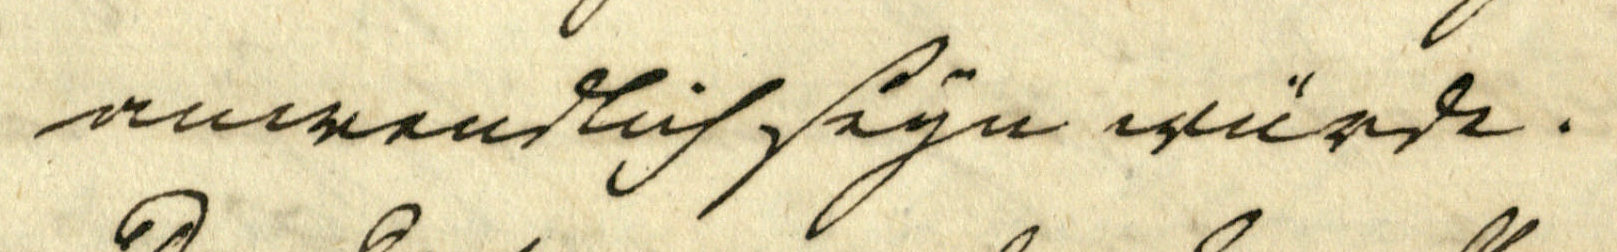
anwendlich seÿn würde.
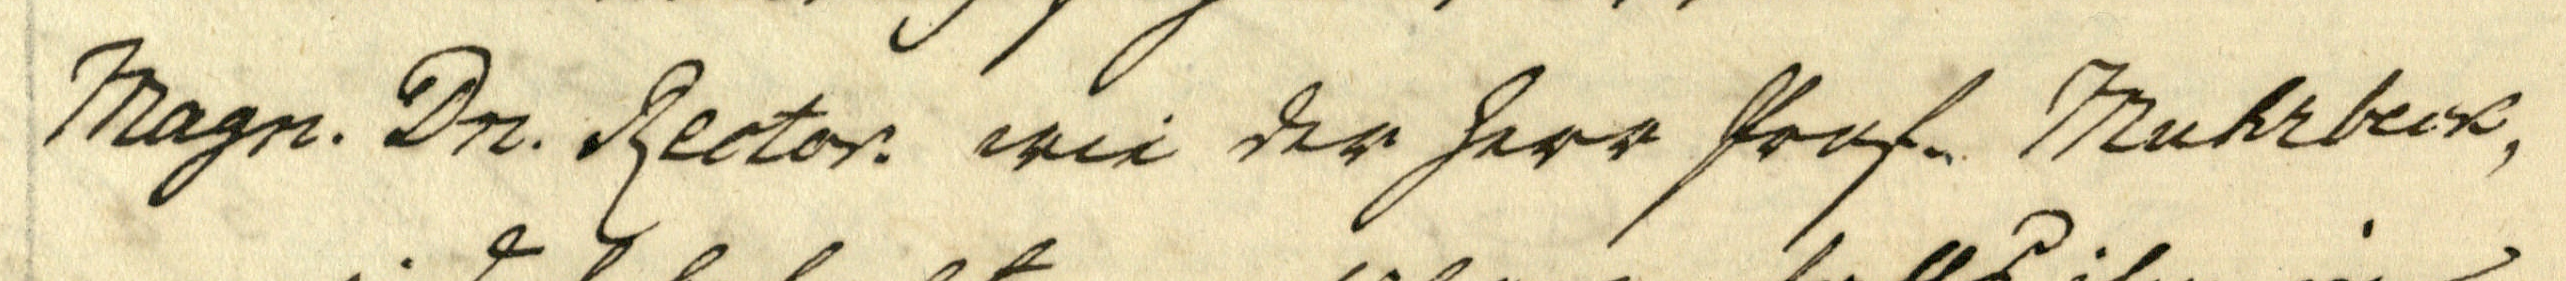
Magn. Dn. Rector. wie der Herr Prof. Muhrbeck,
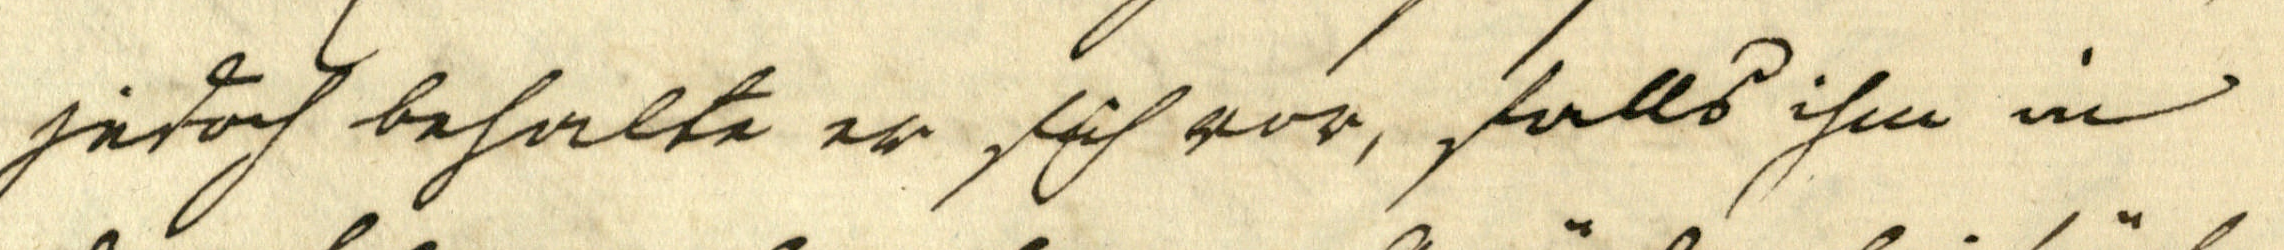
jedoch behalte er sich vor, falls ihm in
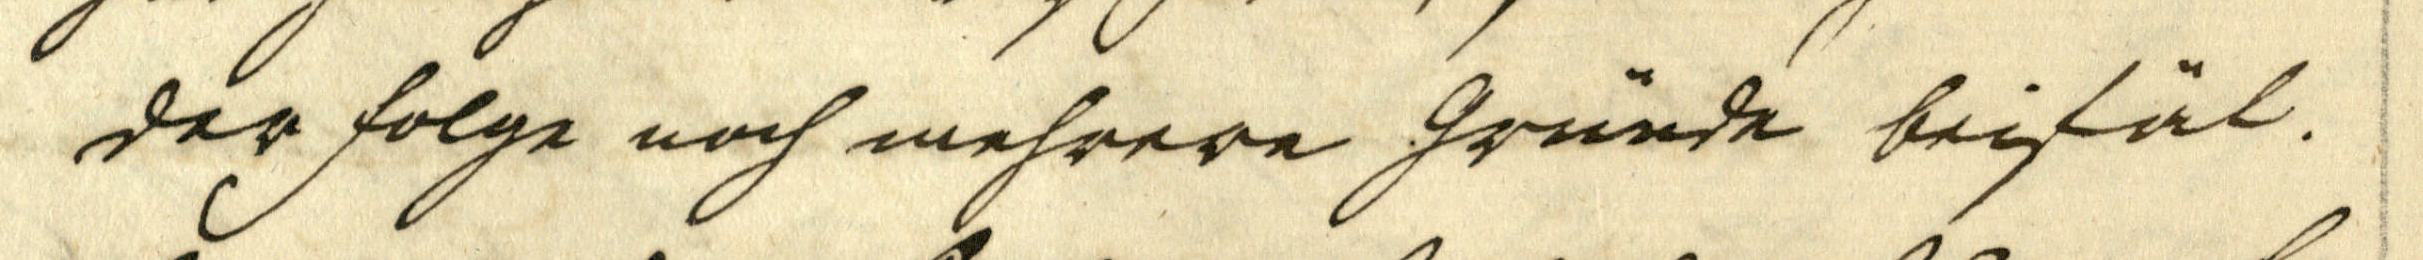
der Folge noch mehrere Gründe beifäl¬
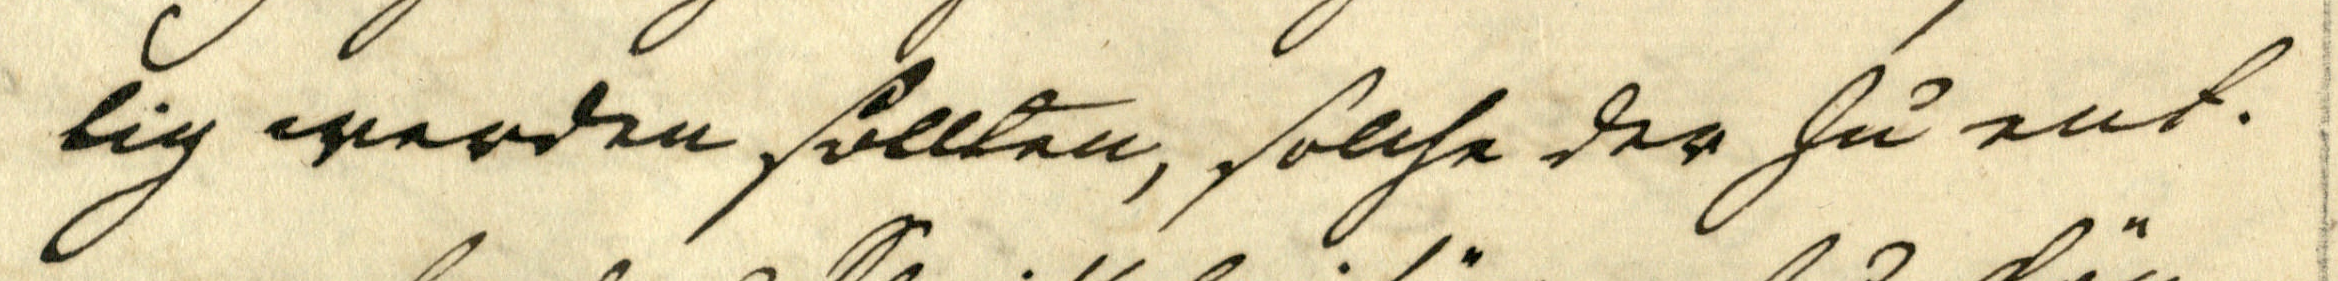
lig werden sollten, solche der zu ent¬
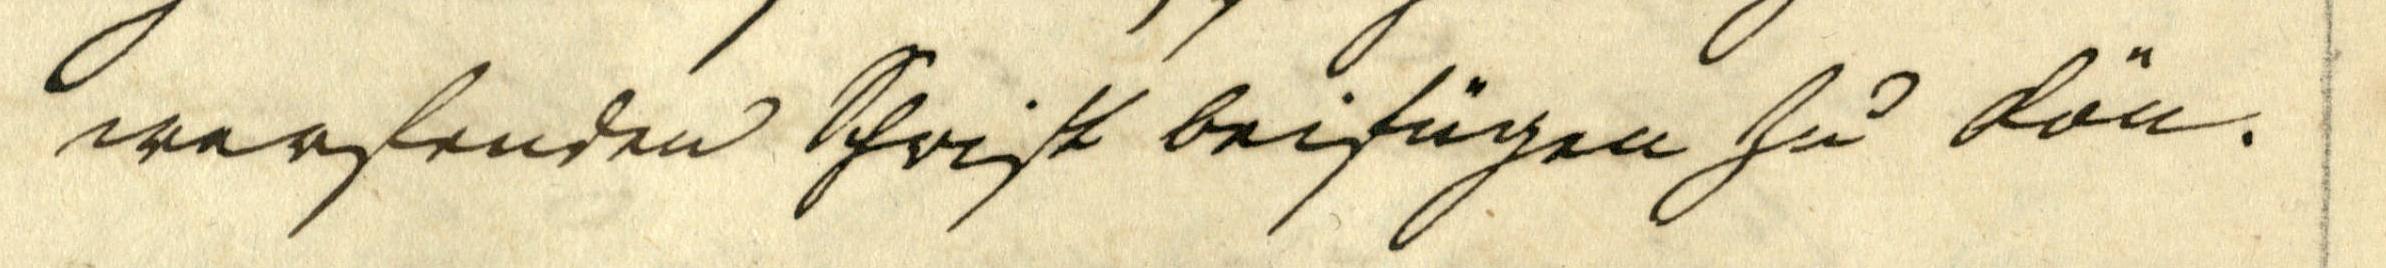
werfenden Schrift beifügen zu kön¬
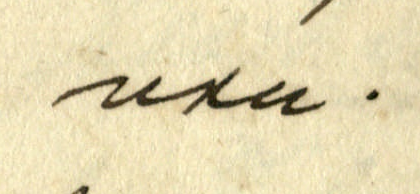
nen.
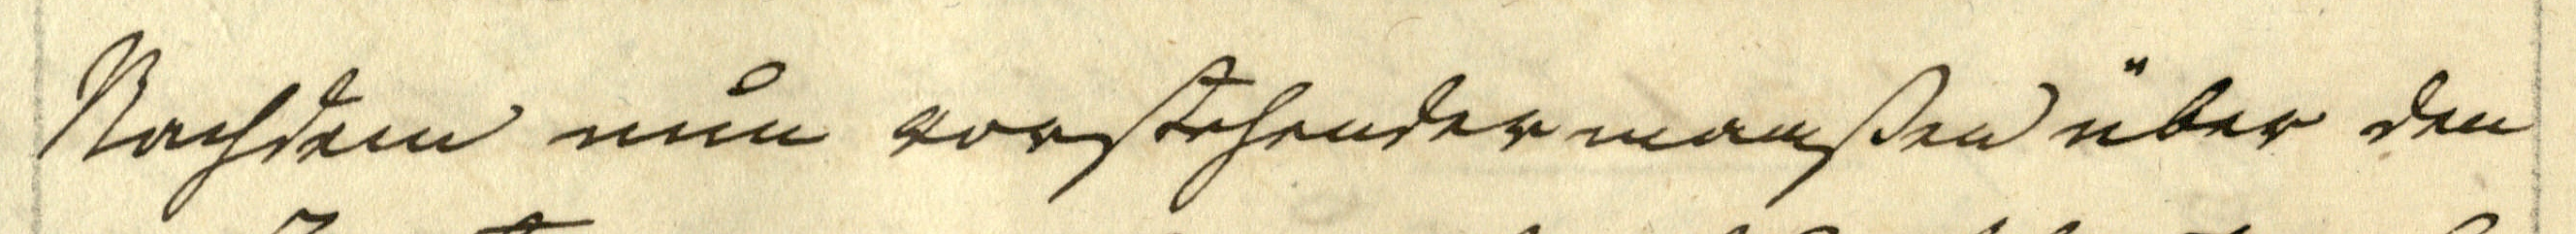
Nachdem nun vorstehendermaaßen über den
